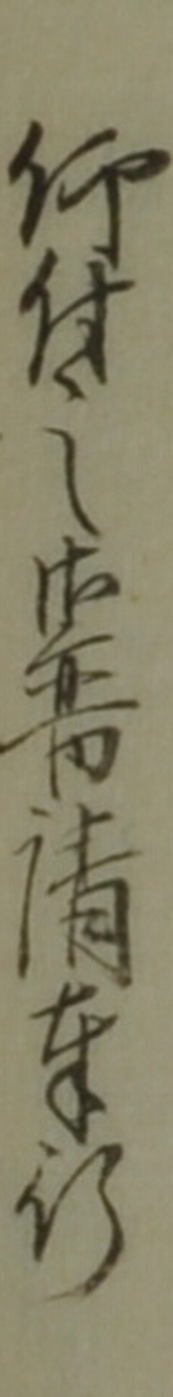仰付之御普請奉行
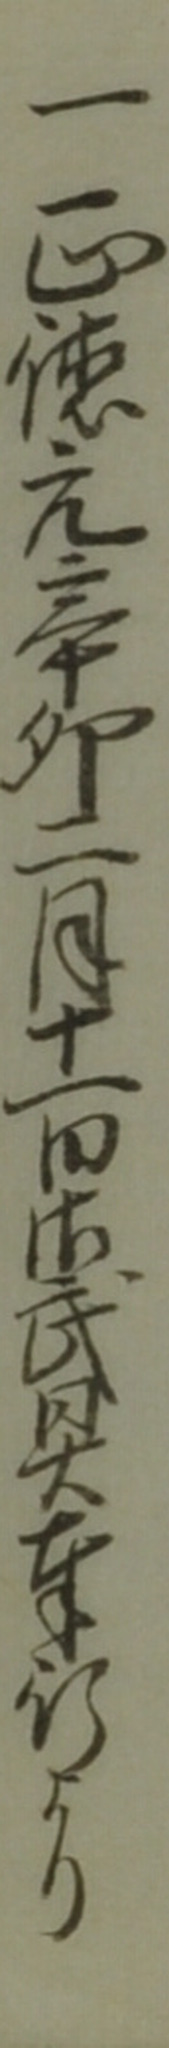一正徳元辛卯二月十一日御武具奉行より
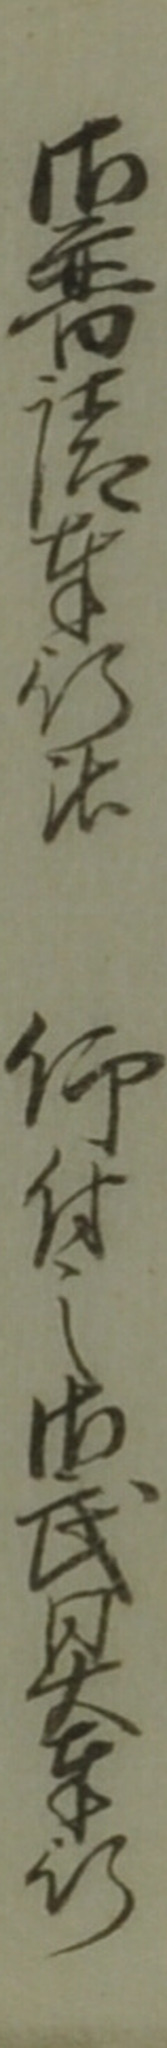御普請奉行被仰付之御武具奉行
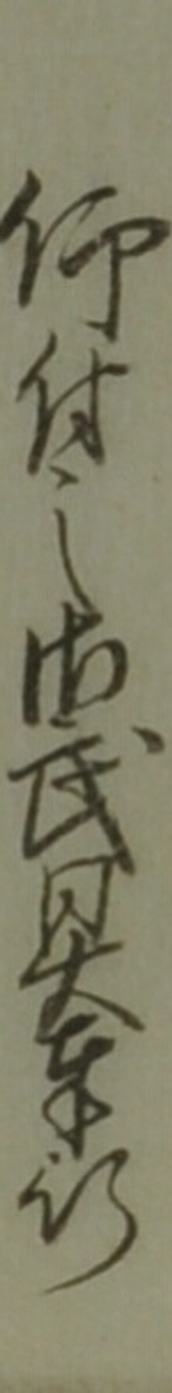仰付之御普請奉行
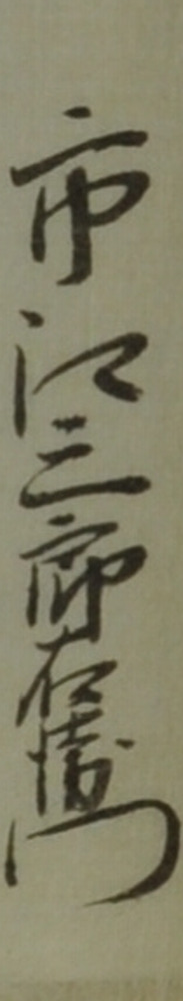市江三郎右衛門
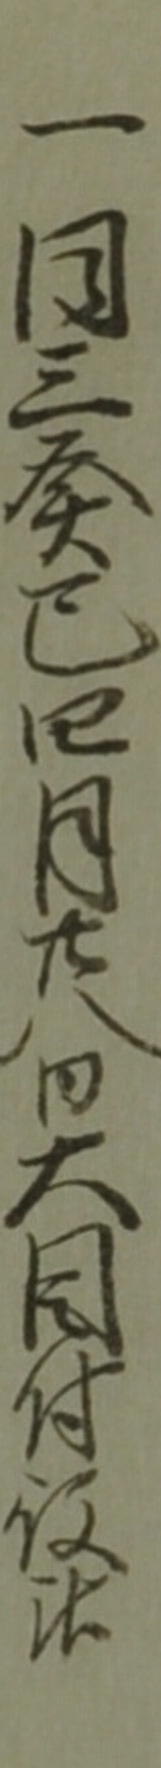一同三癸己四月廿八日大目付役被
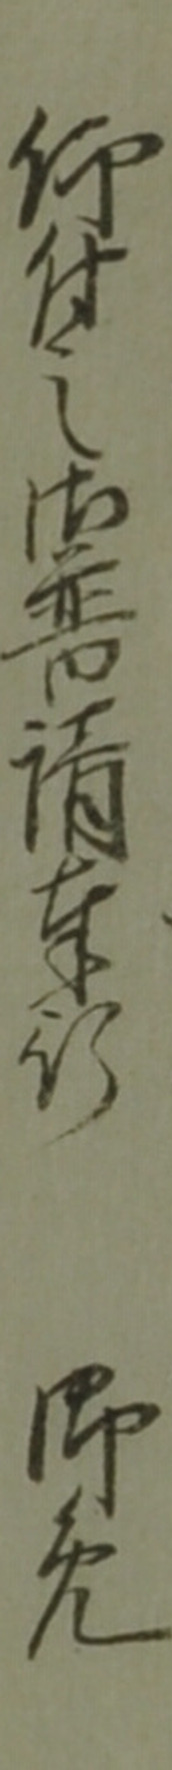仰付之御普請奉行御免
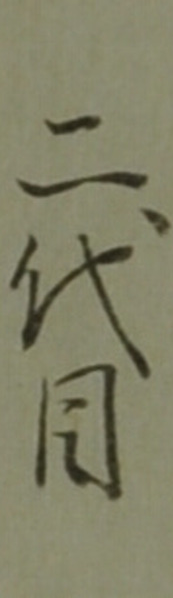二代目
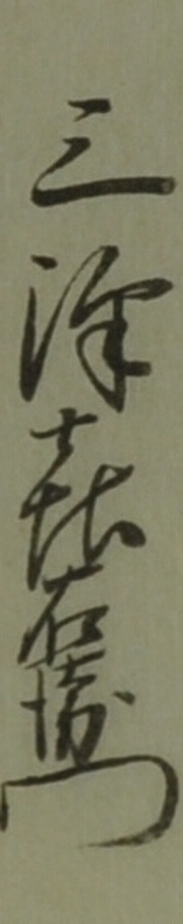三津喜右衛門
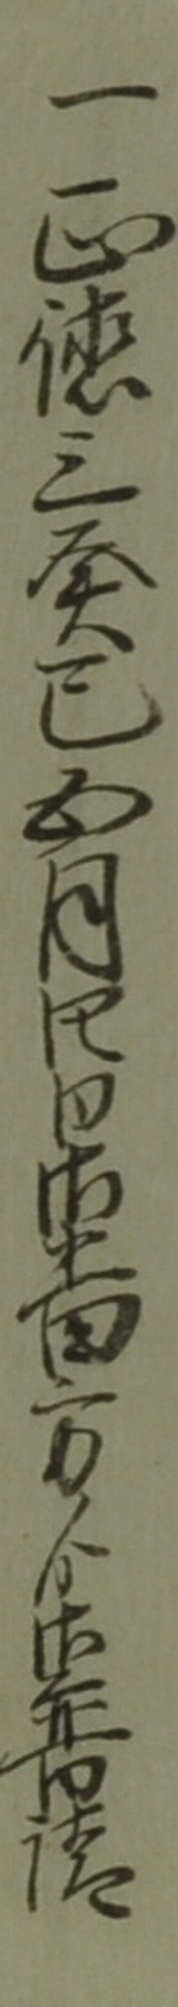一正徳三癸巳五月四日御番方ゟ御普請
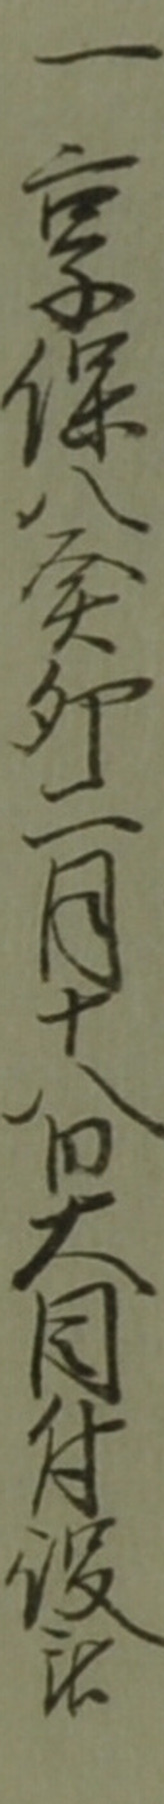一享保八癸卯二月十八日大目付役被
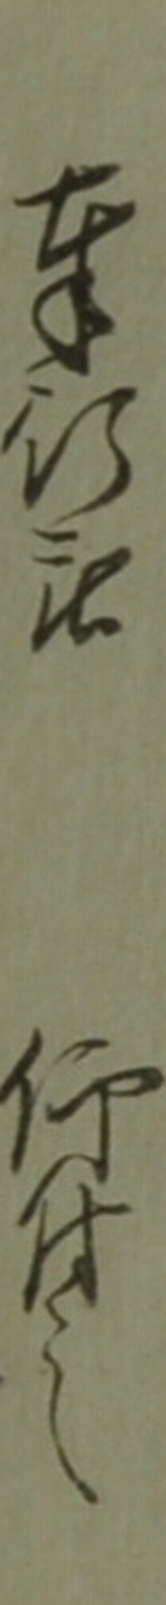奉行被仰付之
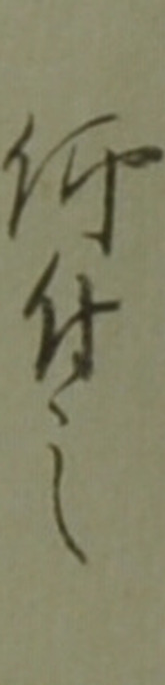仰付之

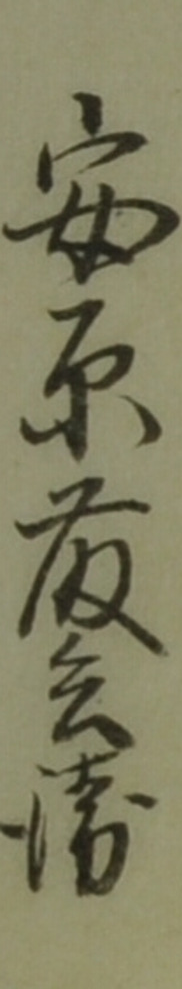安原藤兵衛
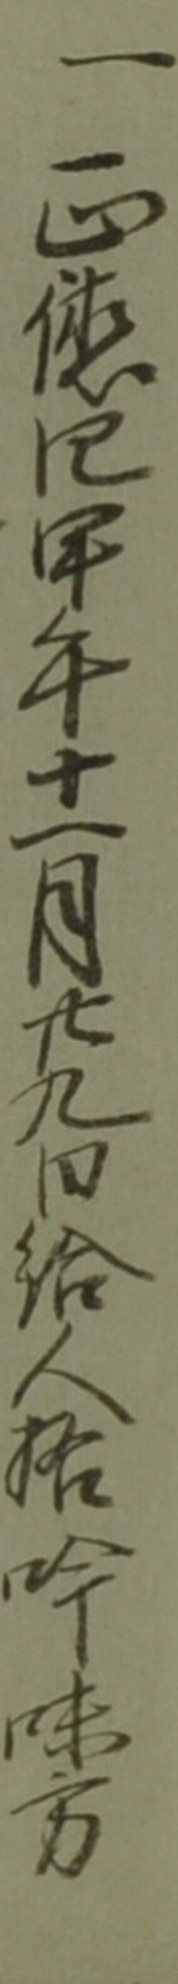一正徳四甲午十一月廿九日給人格吟味方
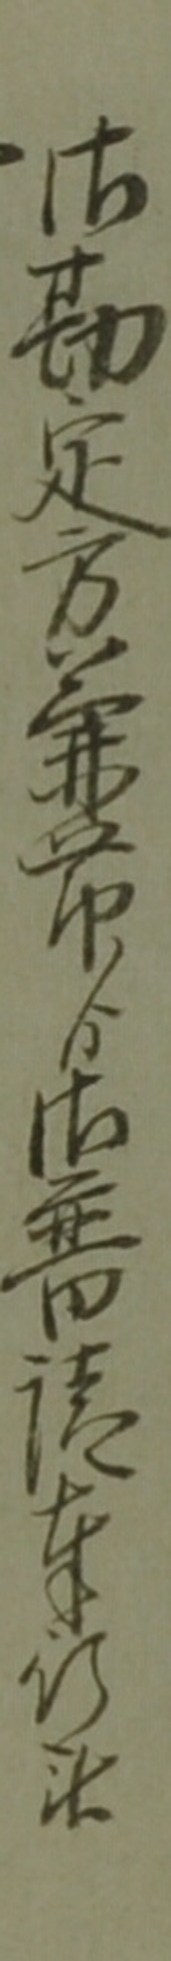御勘定方兼帯ゟ御普請奉行被
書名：諸御役代々録（六）
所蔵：伊那市立高遠町図書館・合同会社AMANE
